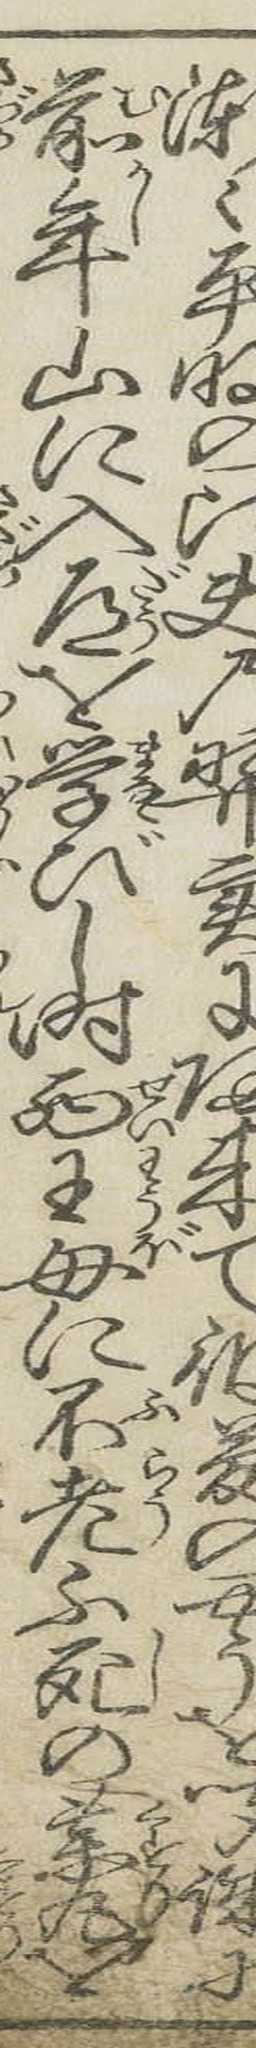前年山に入道を学びし時西王母に不老不死の薬丸を
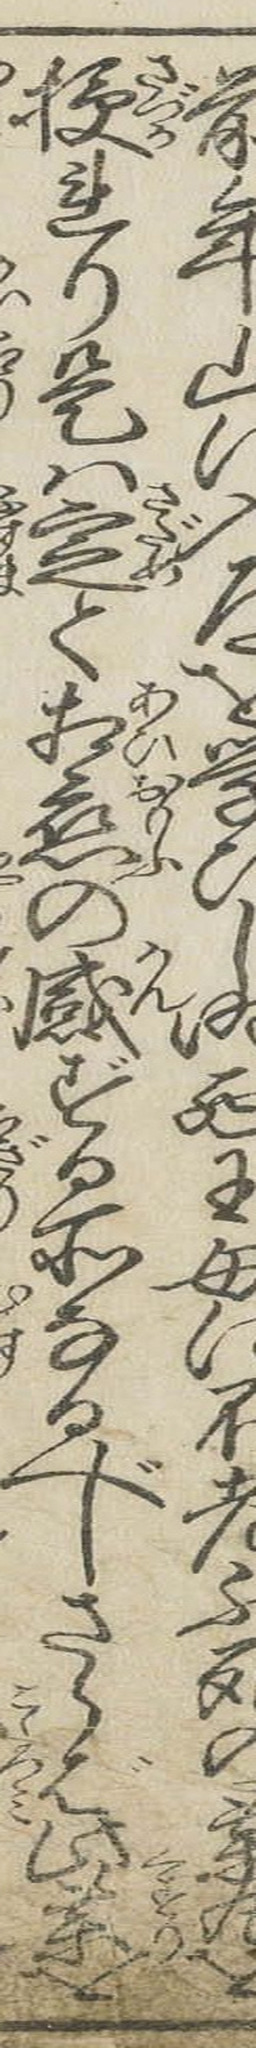授れり是は定て相恋の感ずる所なるべしさらば此薬を
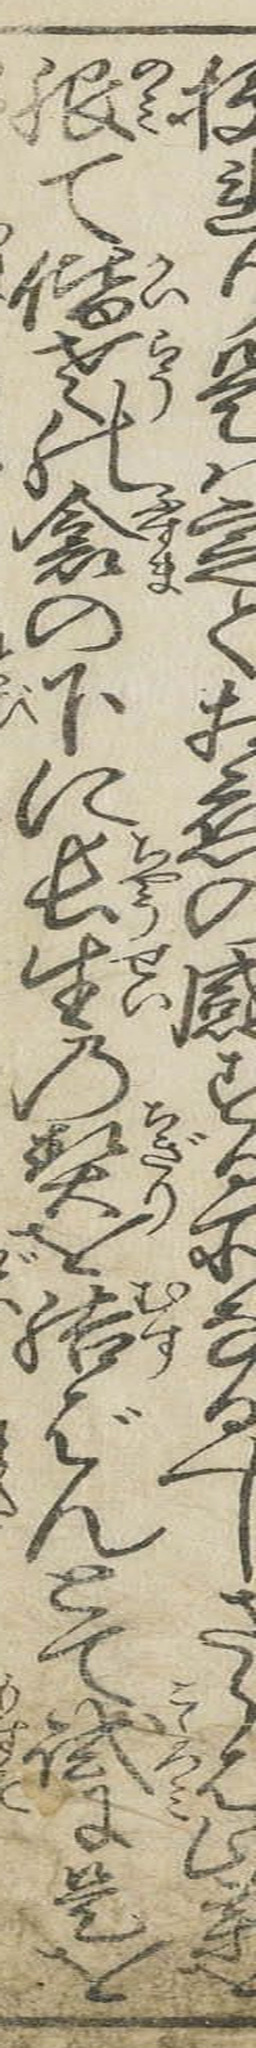服て偕老の衾の下に長生の契を結ばんとて試に是を
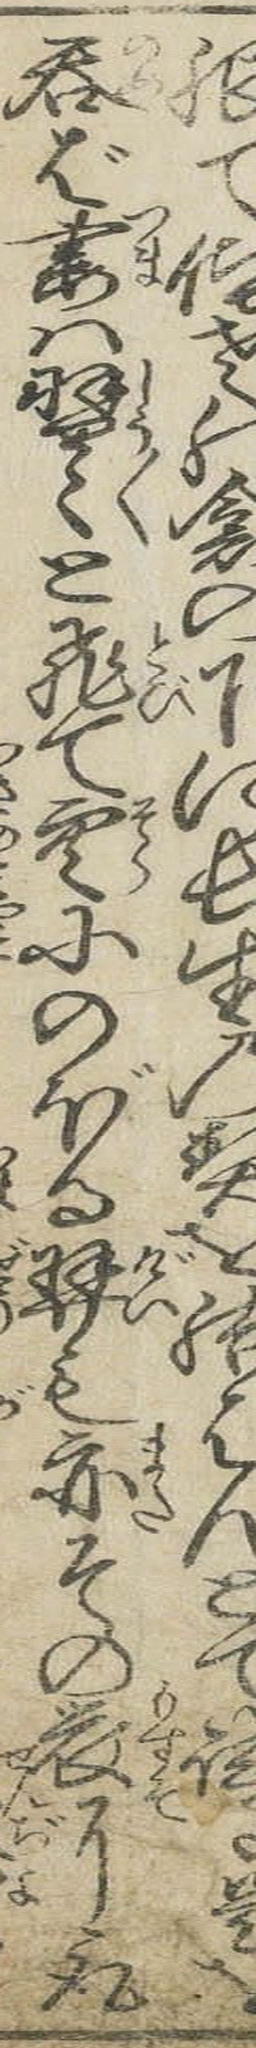呑ば妻は習々と飛て空にのぼる羿も亦その裳に取
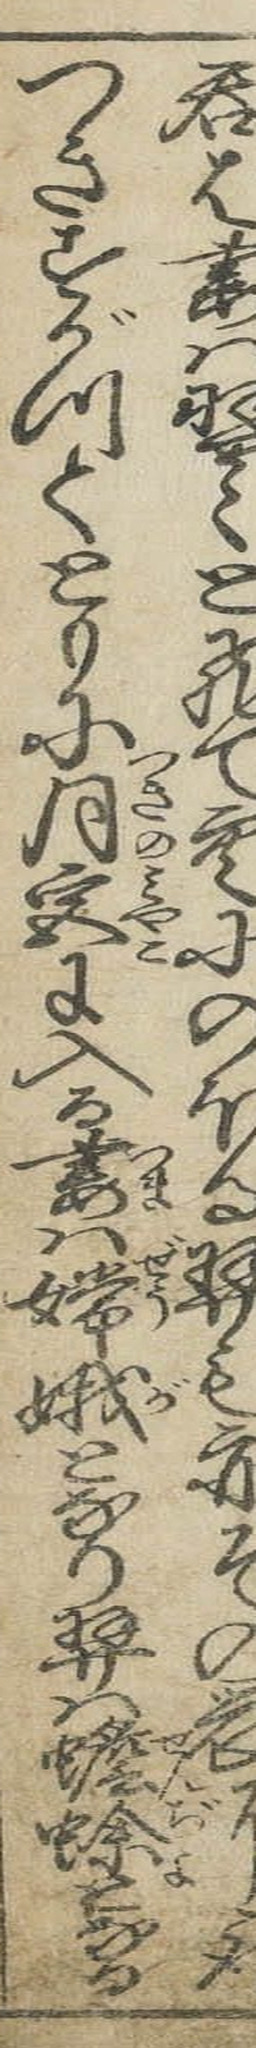つきすがつてともに月宮に入る妻は嫦娥となり羿は蟾蜍となる

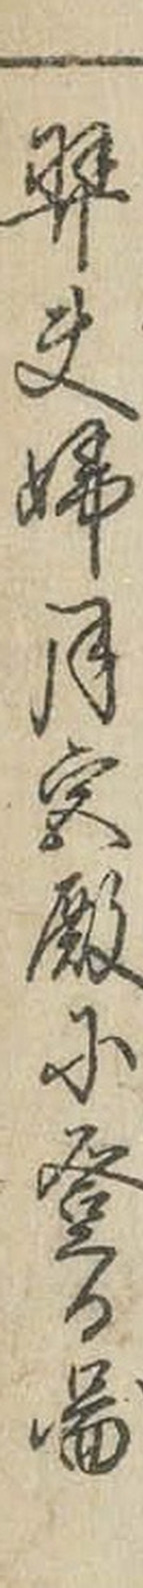羿夫婦月宮殿に登る図

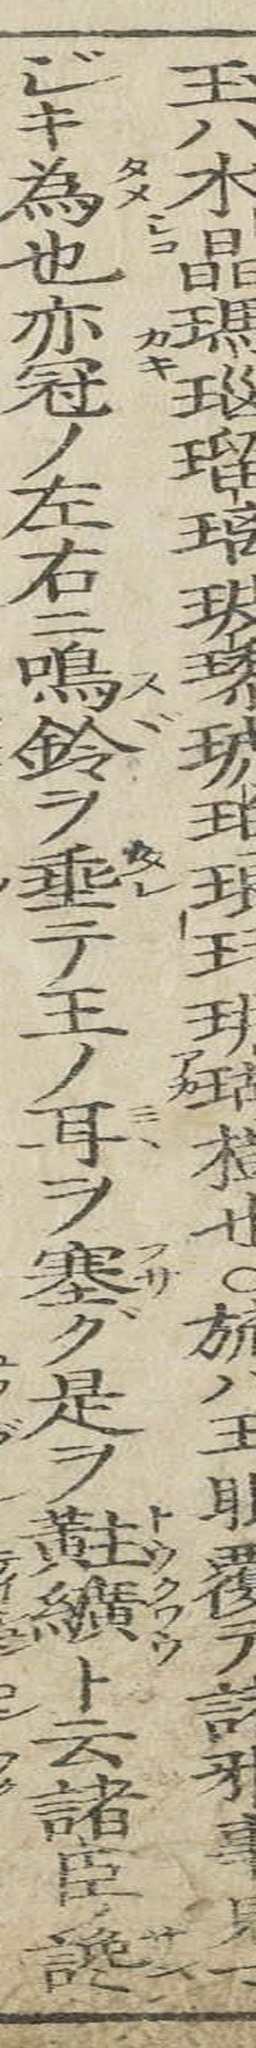ジキ為也亦冠ノ左右ニ鳴鈴ヲ垂テ王ノ耳ヲ塞グ是ヲ黈纊ト云諸-臣ノ讒
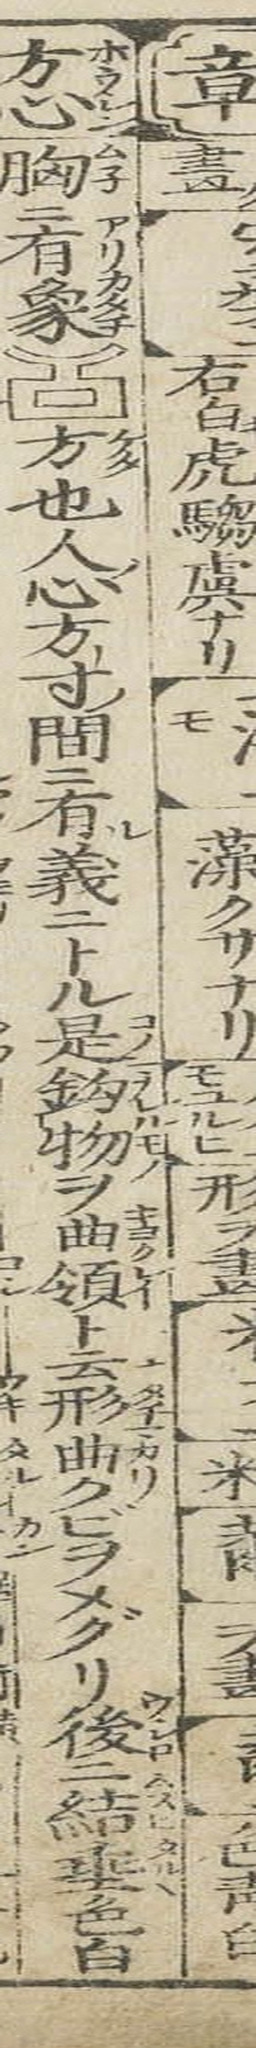方心胸ニ有象方也人心方-寸間ニ有義ニトル是鉤-物ヲ曲領ト云形曲クビヲメグリ後ニ結垂色白
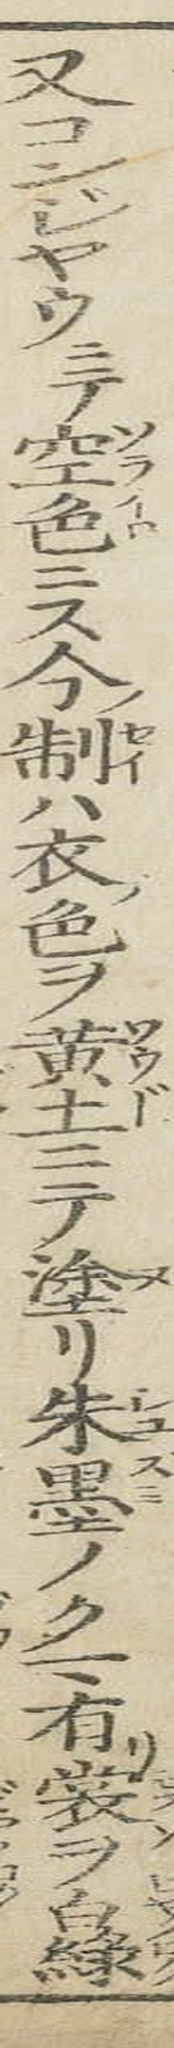又コンジヤウ空色ニス今制ハ衣色ヲ黄土ニテ塗リ朱墨ノクマ有裳ヲ白緑
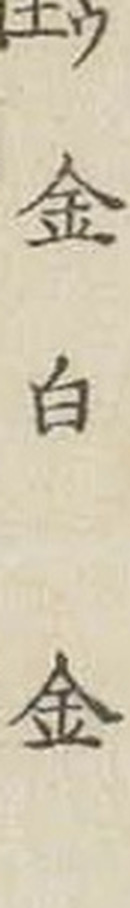黈金白金
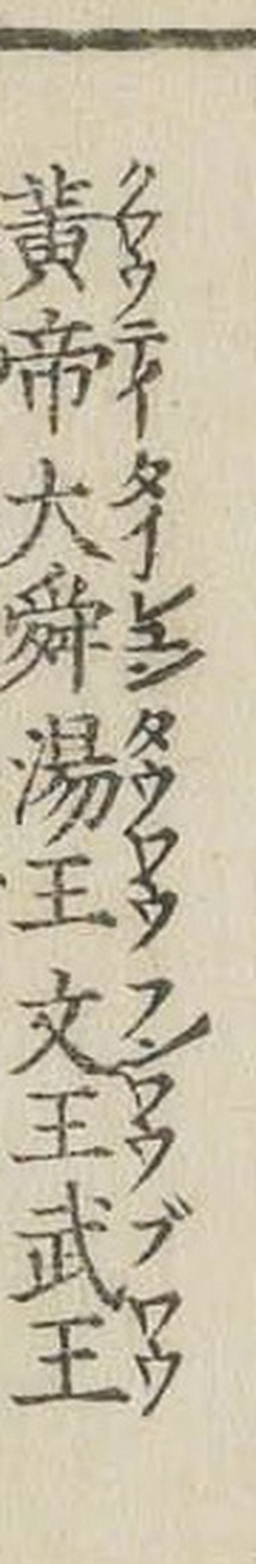黄帝大舜湯王文王武王
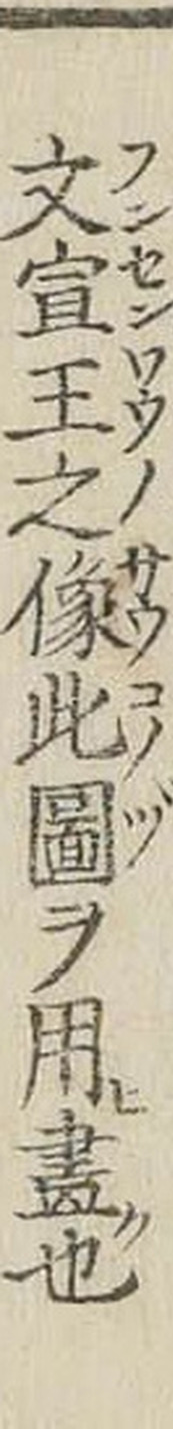文宣王之像此図ヲ用画也

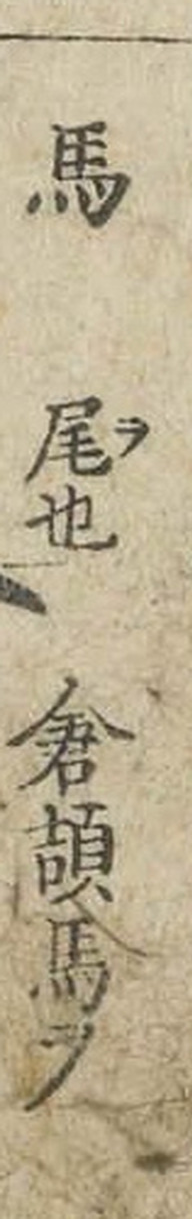馬尾也倉頡馬ヲ
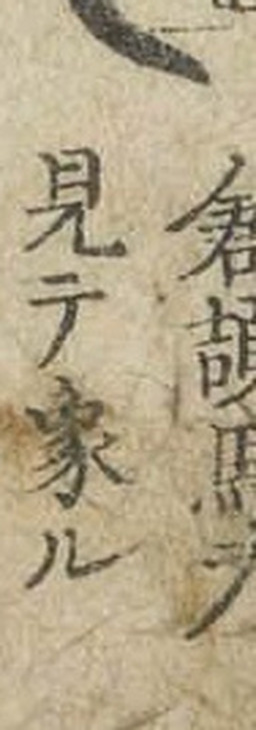見テ象ル
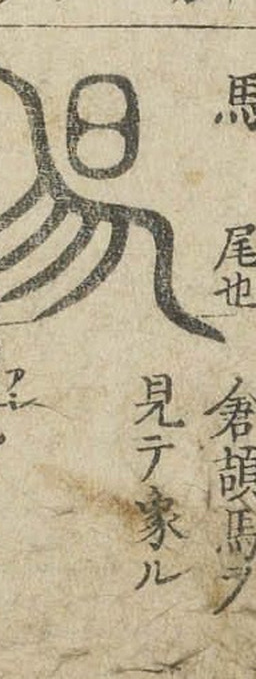見テ象ル
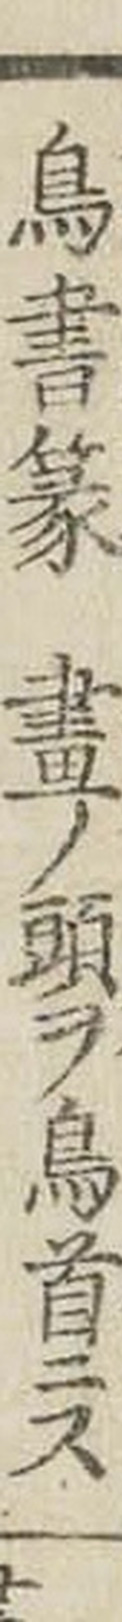鳥書篆画ノ頭ヲ鳥首ニス
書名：絵本写宝袋 9巻 4之巻
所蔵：東京学芸大学教育コンテンツアーカイブ
